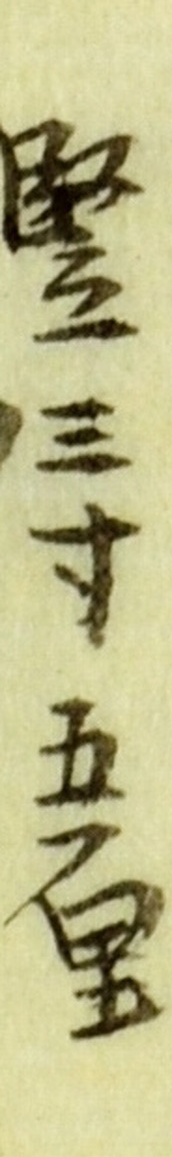竪三寸五厘
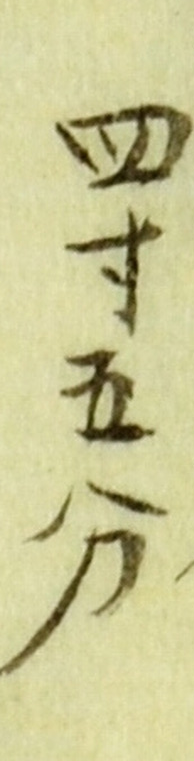四寸五分
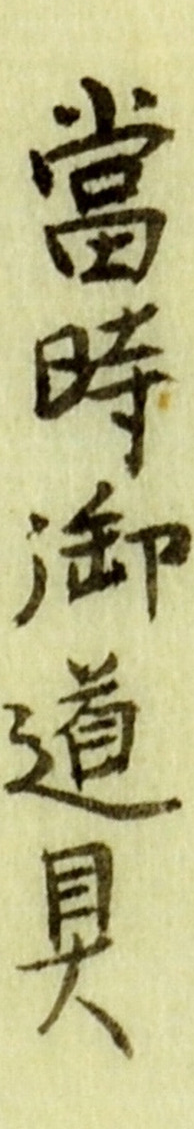当時御道具
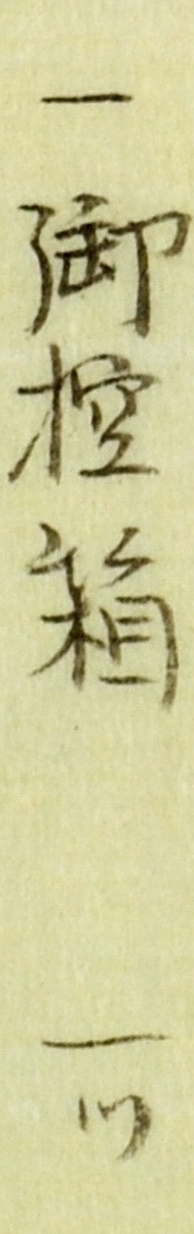一御控箱一ツ
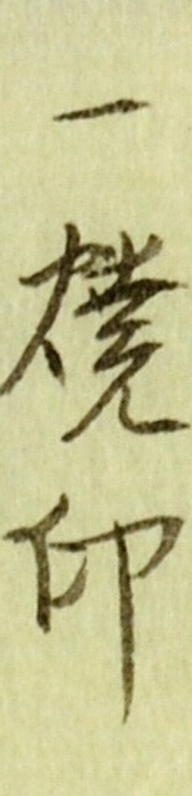一焼印
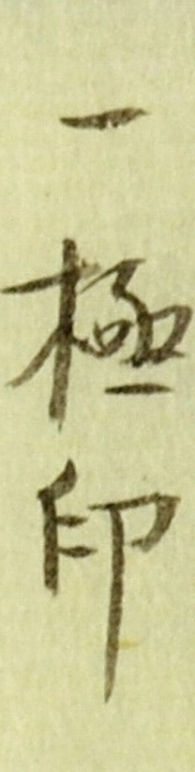一極印

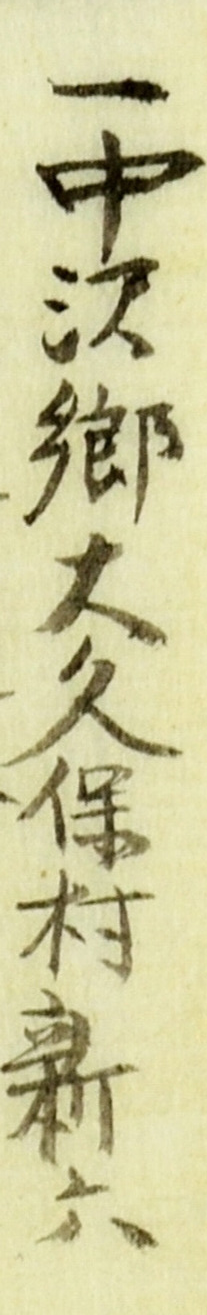一中沢郷大久保村新六
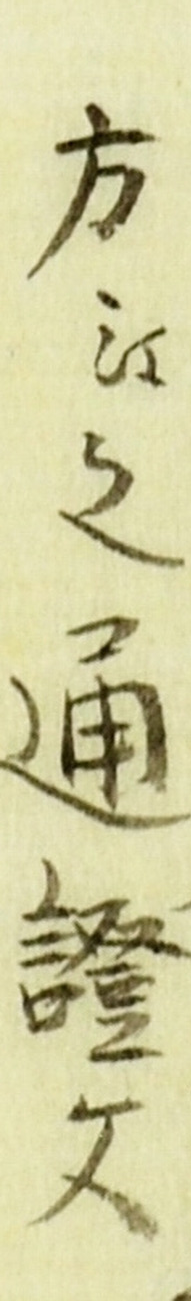方江之通証文
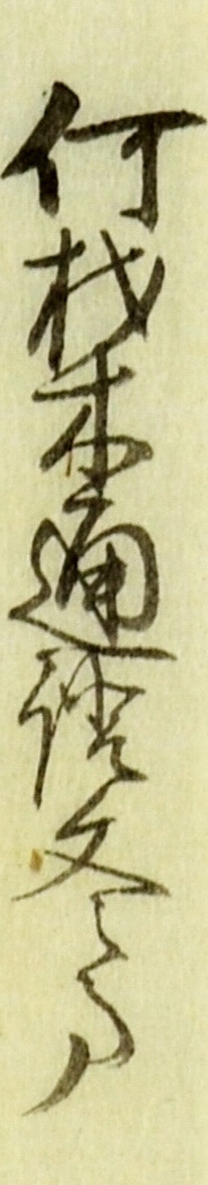何材木通証文之事
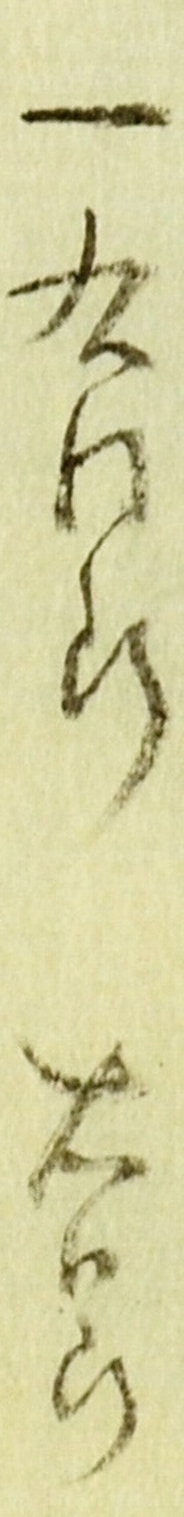一右同断右同断
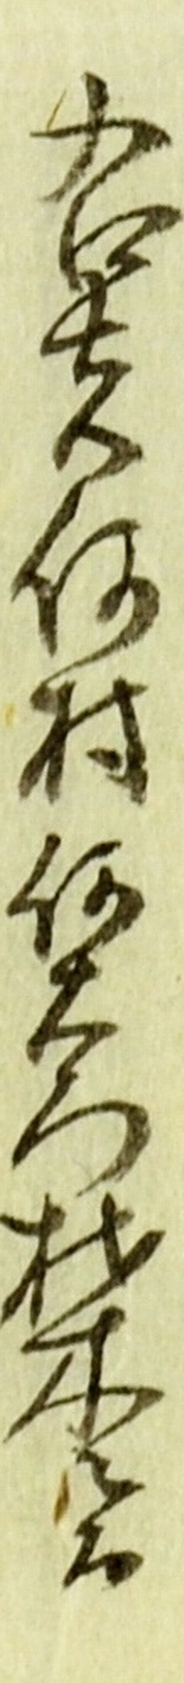右者何村何右衛門材木候而
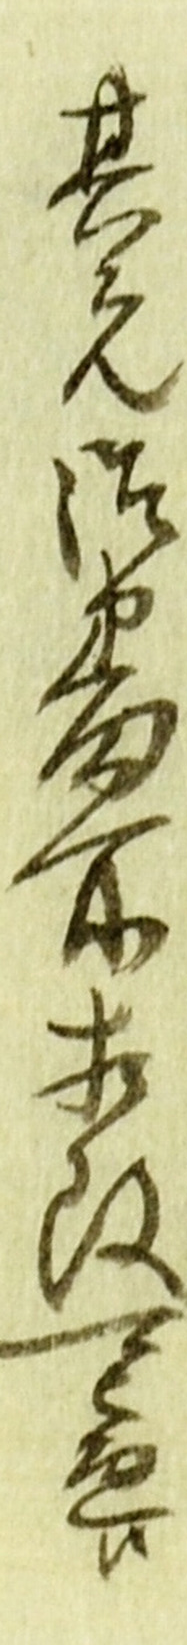其元御番所相改可被通候
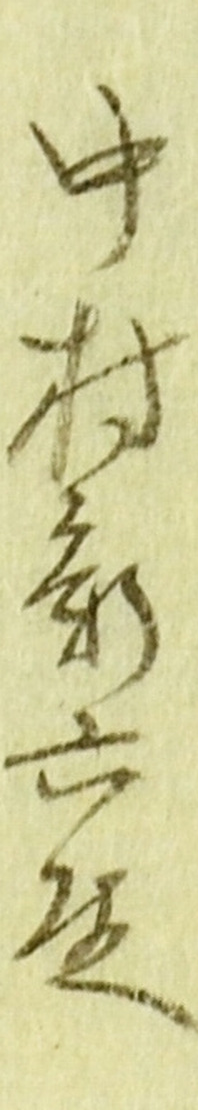中村新六殿
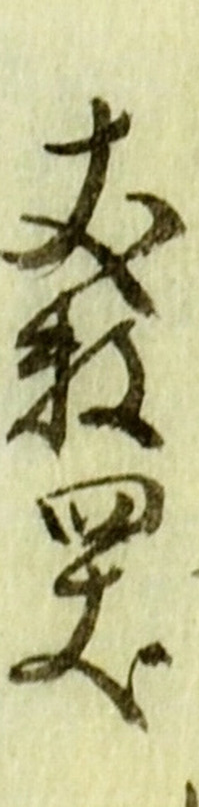丈数四丈
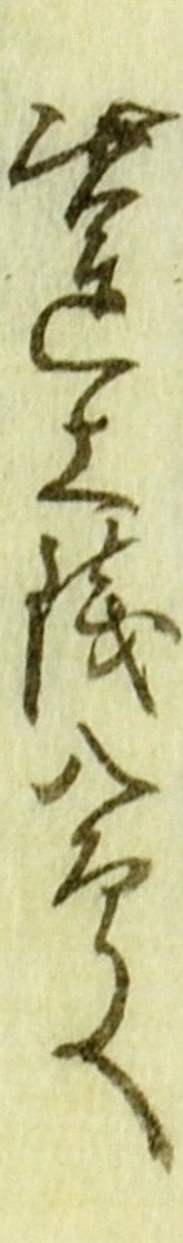此運上銭八百文
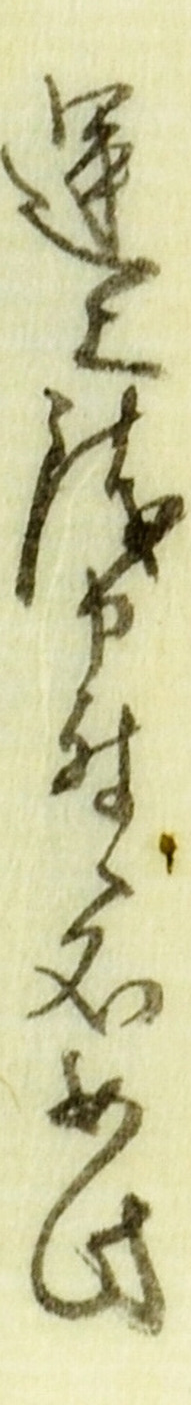運上銭申付候名如此
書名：分一御定法
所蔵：伊那市立高遠町図書館・合同会社AMANE
